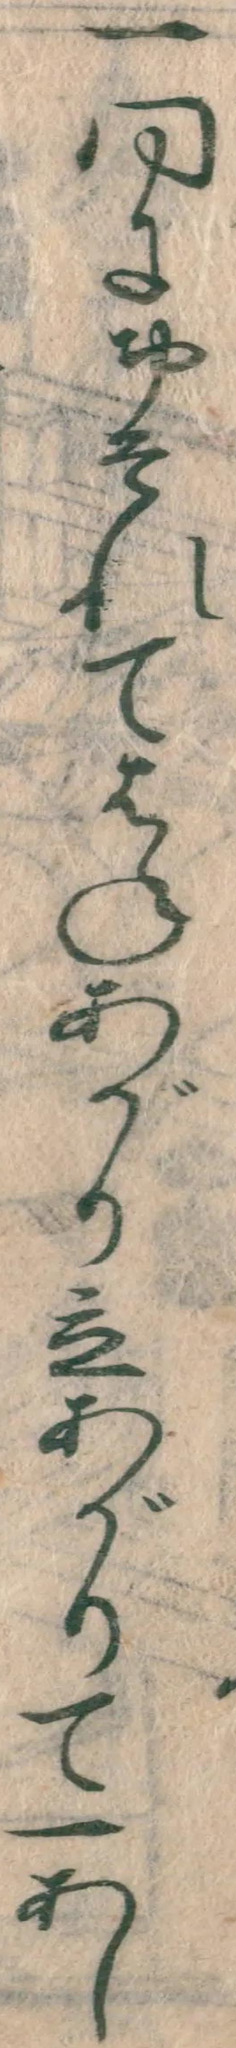一同におそれてはねあがり立あがりて一あし
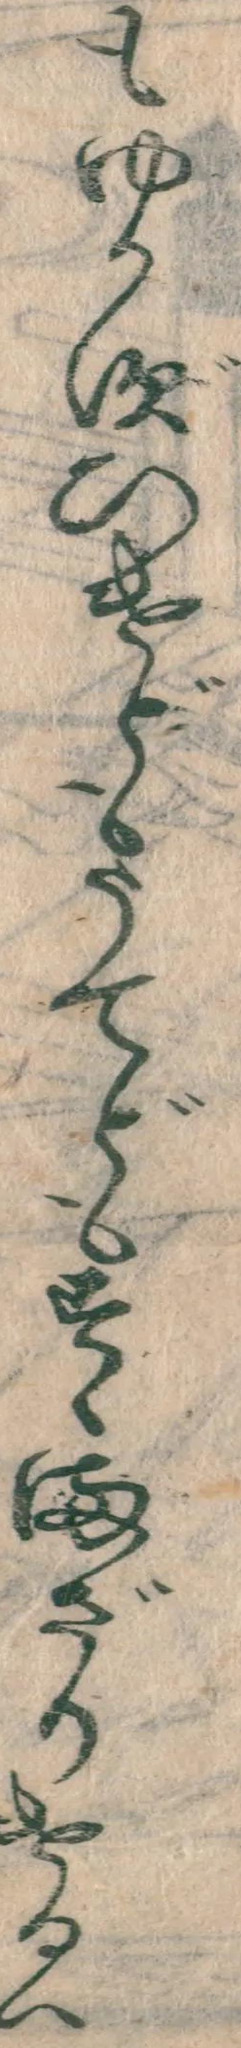もゆかずひけどもうてどもすゝまざりけるは
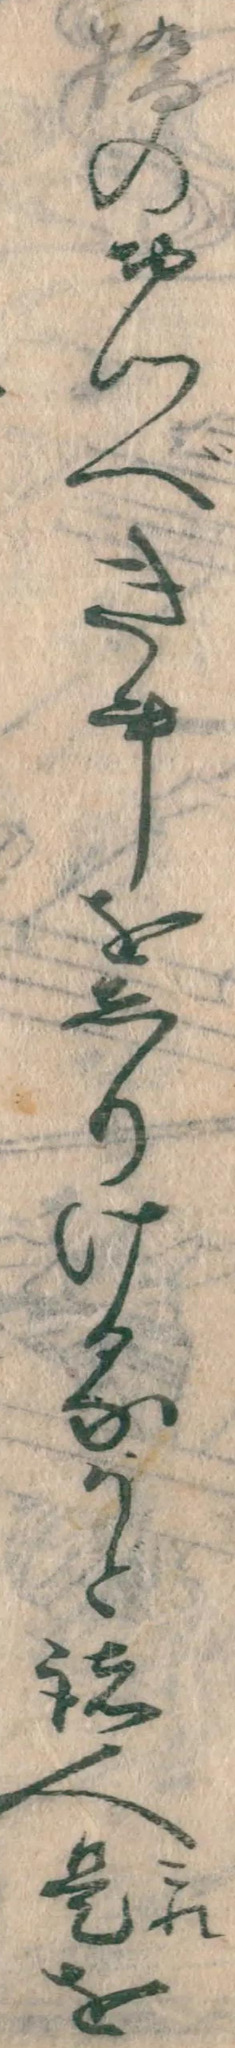橋のおつべき事をしりけるかと諸人是を
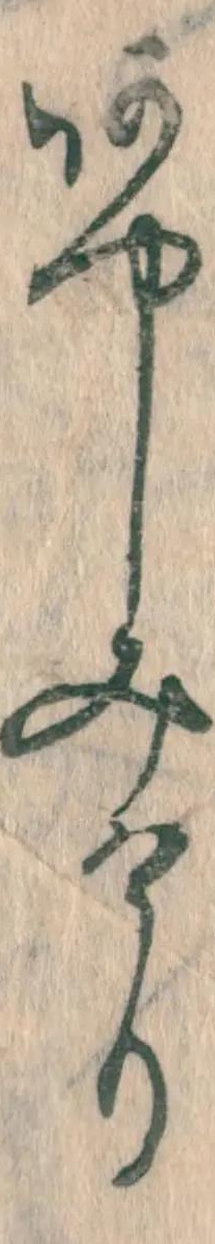あやしみけり
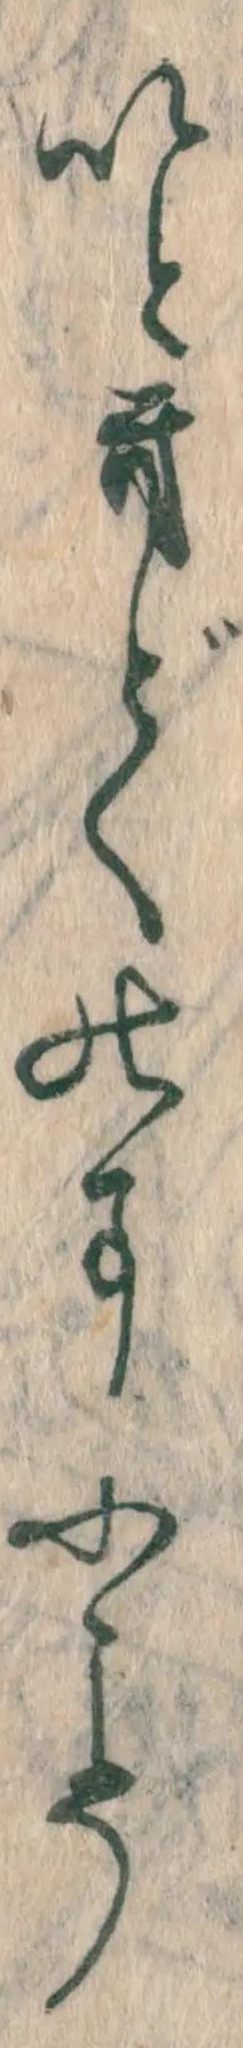いときどくの事にこそ

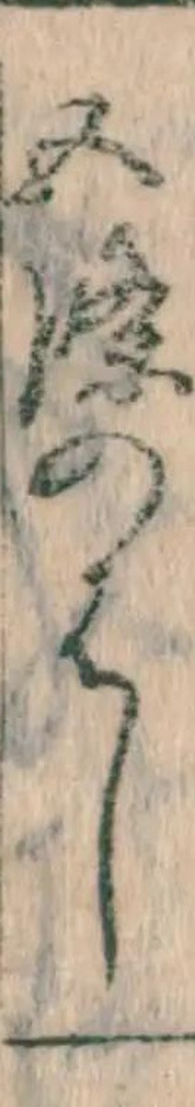五條のはし
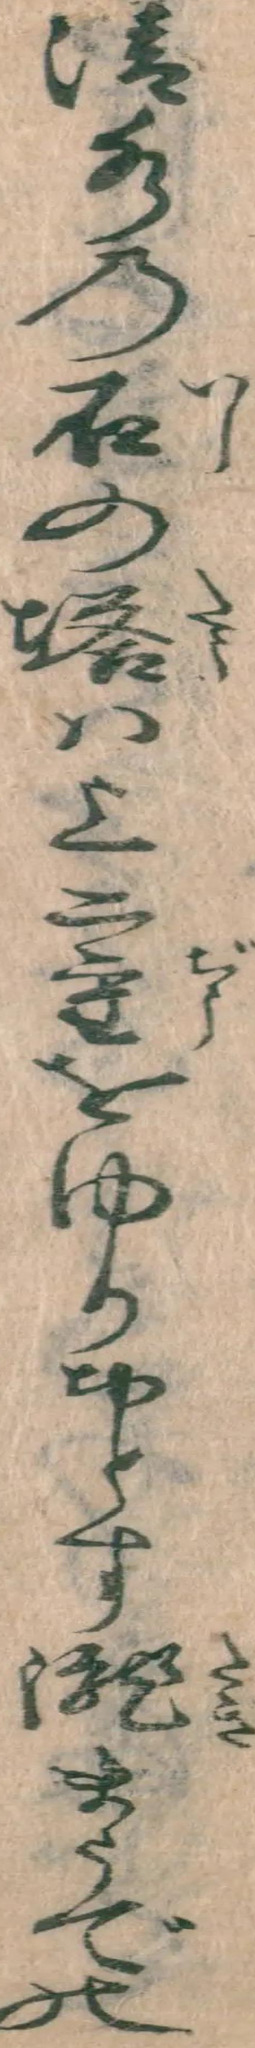清水の石の塔は上二重をゆりおとす瀧まうでの
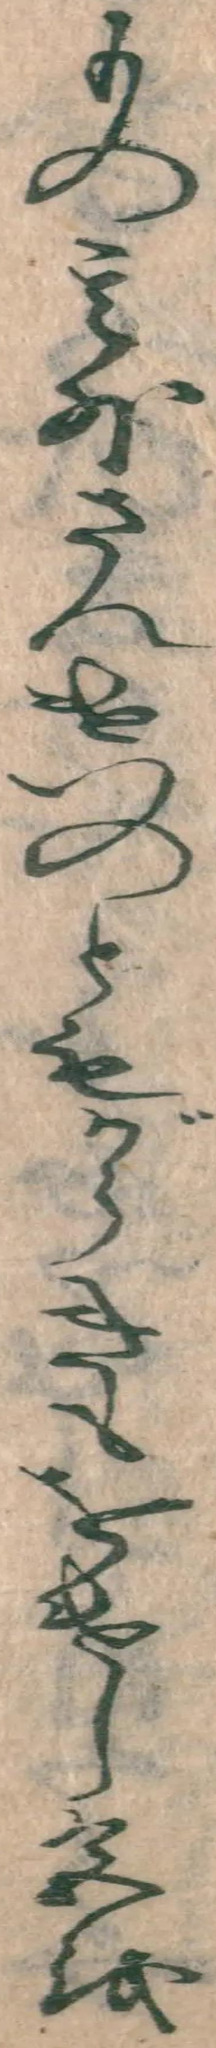もの其外さんけいのともがらきもをけし色を
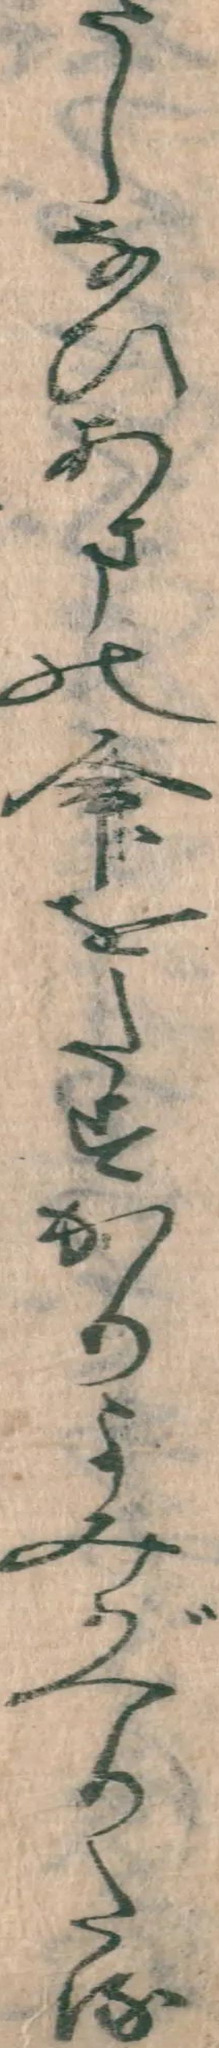うしなひあまの命をたすかりよみがへりたる
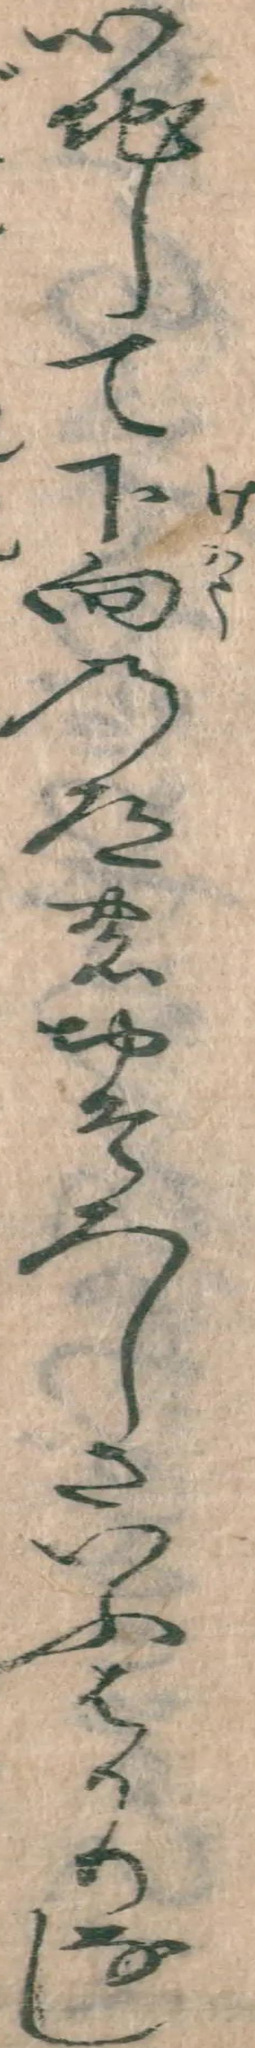心地して下向の道のおそろしさいふはかりなし
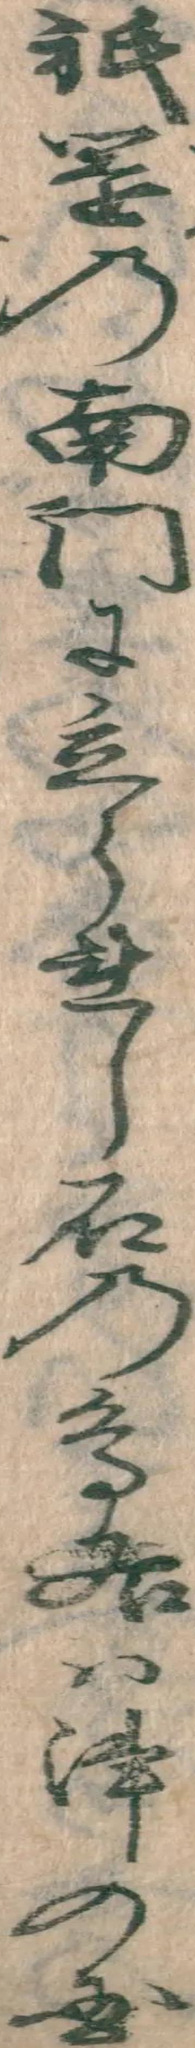祇園の南門に立ゝれし石の鳥居は津の国
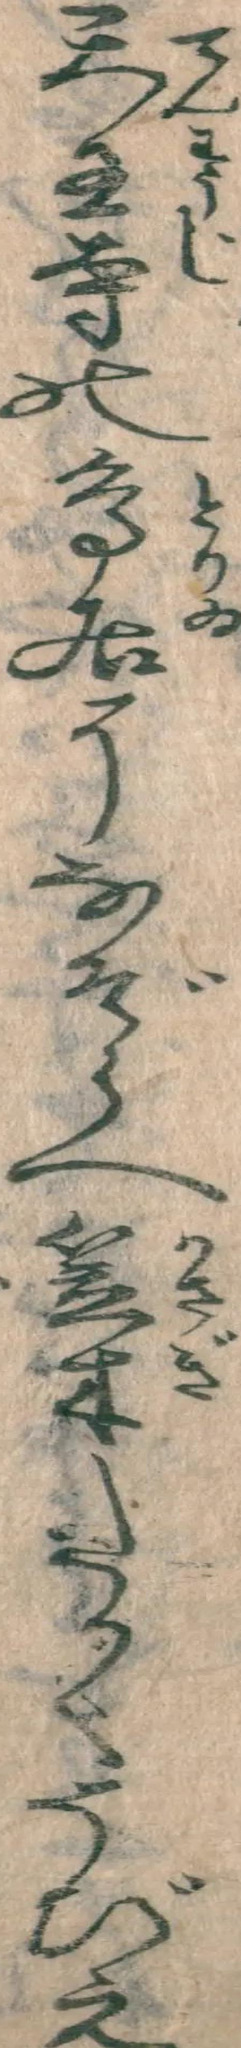天王寺の鳥居になぞらへ笠木たかくそびえ
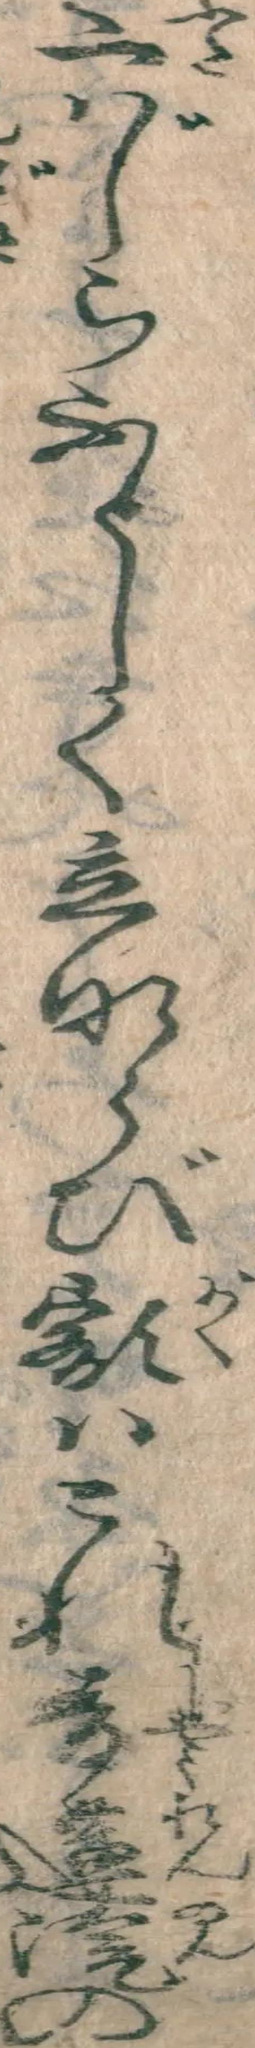二ばしらふとしく立ならび額はこれ青蓮院の
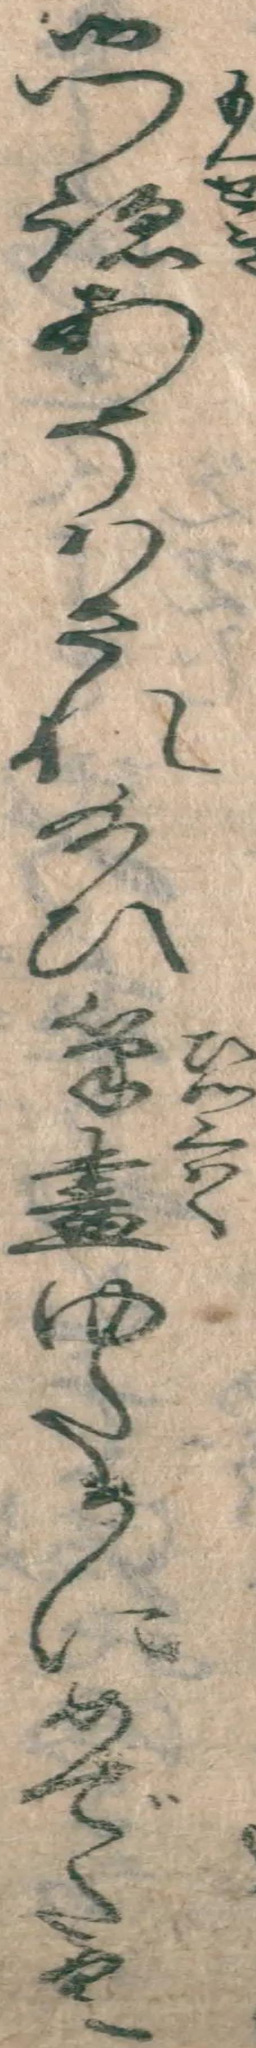御門跡あそはされ給ひ筆画ゆたかにめでたく
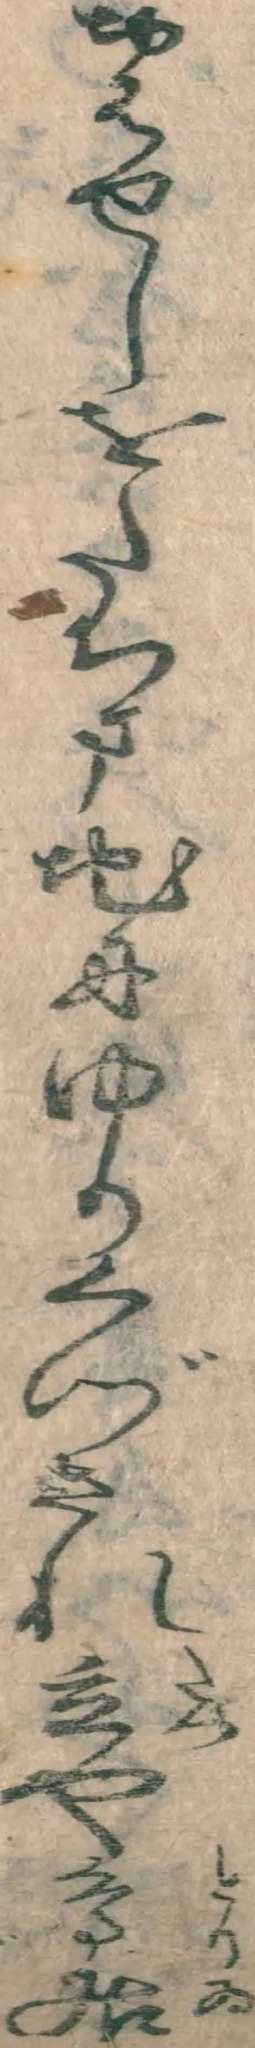おはせしをたちまちにゆりくづされ立や鳥居
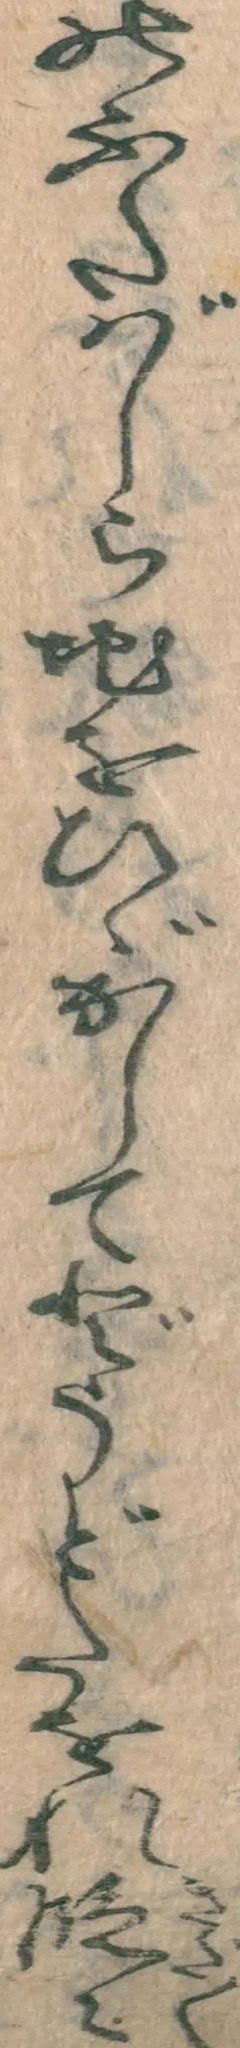のふたばしら地をひゞかしてどうどたをれ段々
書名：艱難目異志. 上,下
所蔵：国立国会図書館 National Diet Library, JAPAN
